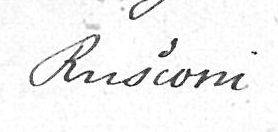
Rusconi 4 "
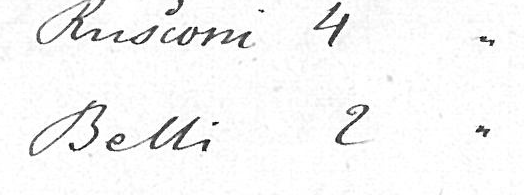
Beli 2 "
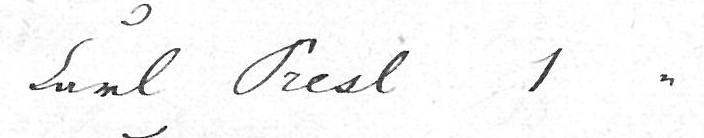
Carl Presl 1 "
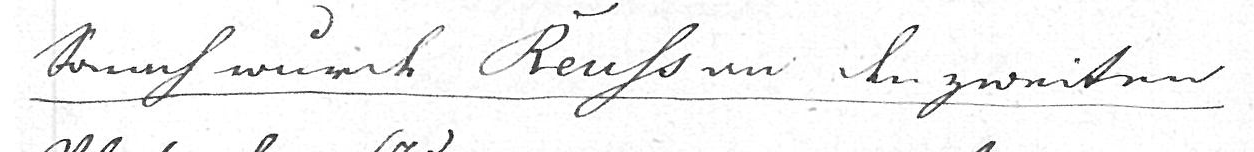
Sonach wurde Reuss an den zweiten
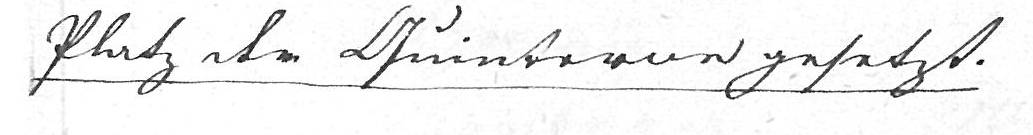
Platz der Quinterne gesetzt.
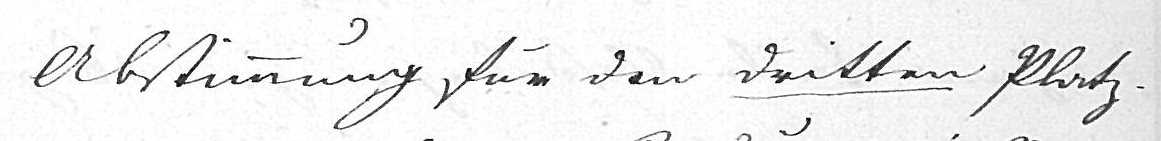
Abstimmung für den dritten Platz.
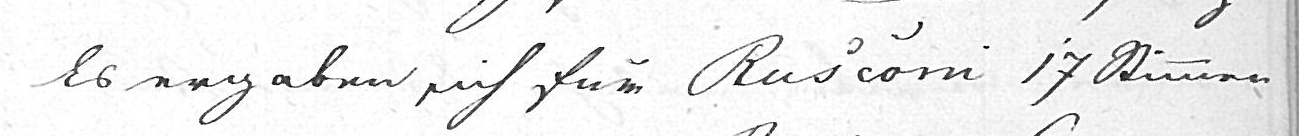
Es ergaben sich für Rusconi 17 Stimmen
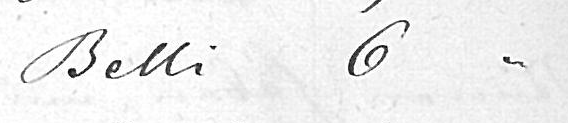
Belli 6 "
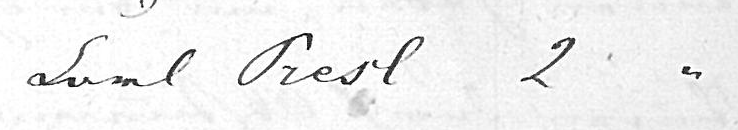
Carl Presl 2 "
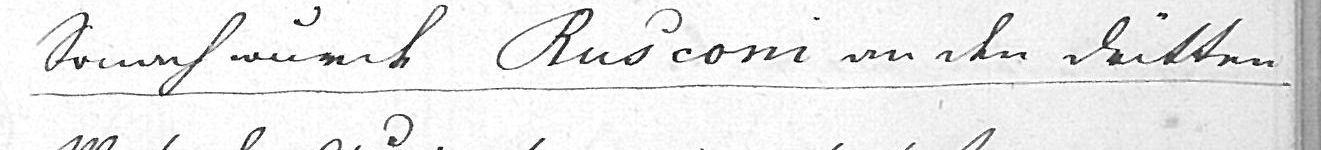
Sonach wurde Rusconi an den dritten
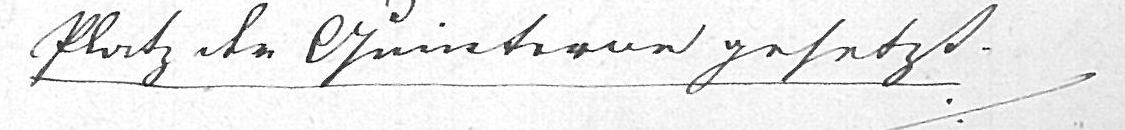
Platz der Quinterne gesetzt.
